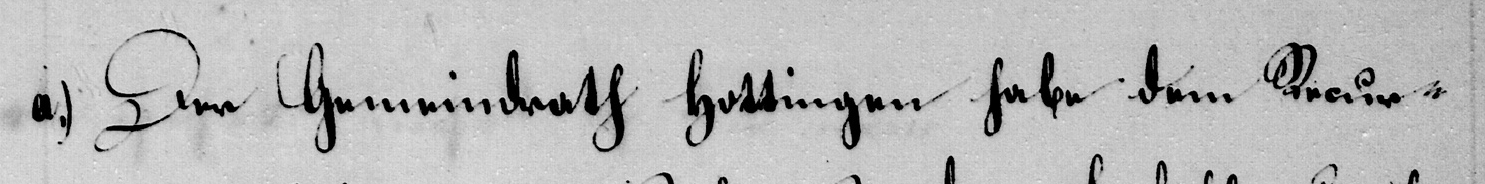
a.) Der Gemeindrath Hottingen habe dem Recur¬
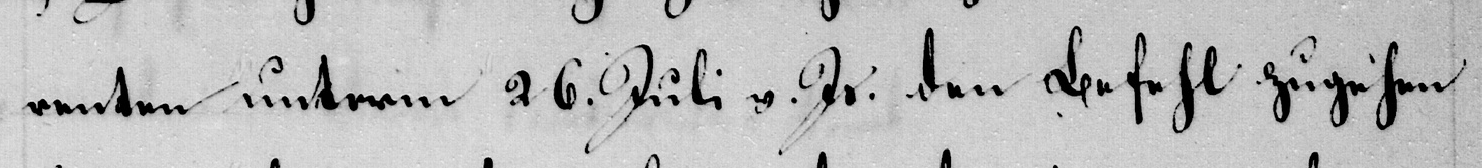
renten unterm 26. Juli v. Js. den Befehl zugehen
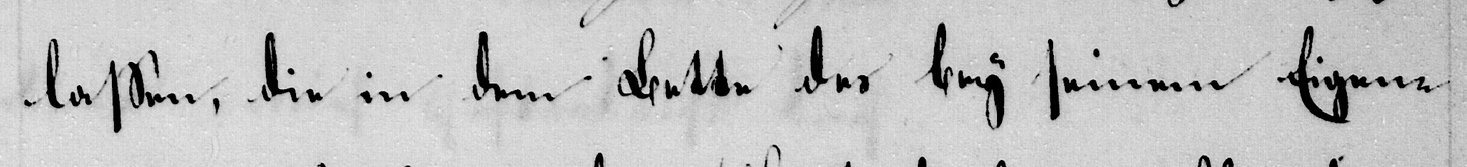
laßen, die in dem Bette des bey seinem Eigen¬
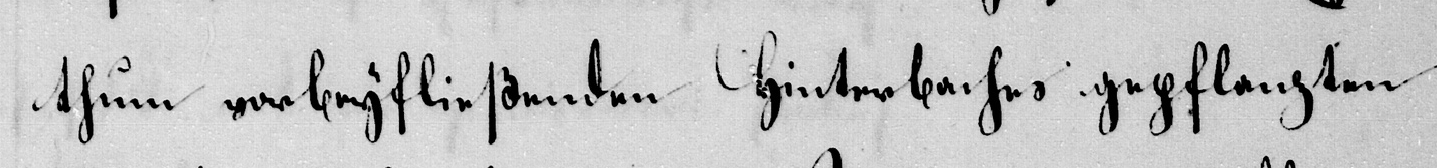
thum vorbeyfließenden Hinterbaches gepflanzten
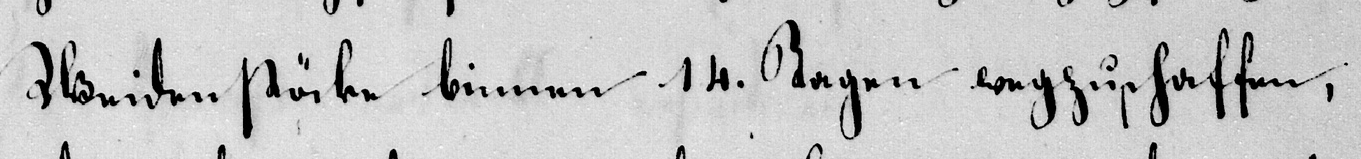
Weidenstöcke binnen 14. Tagen wegzuschaffen,
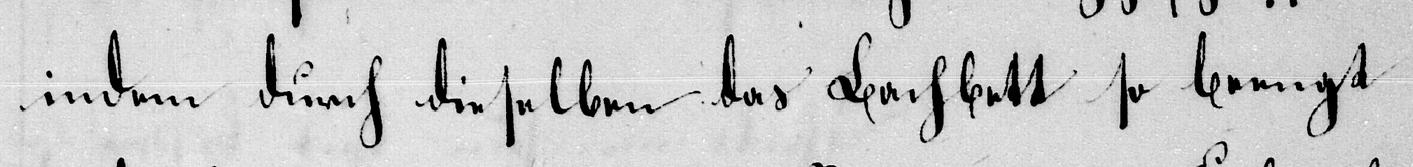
indem durch dieselben das Bachbett so beengt
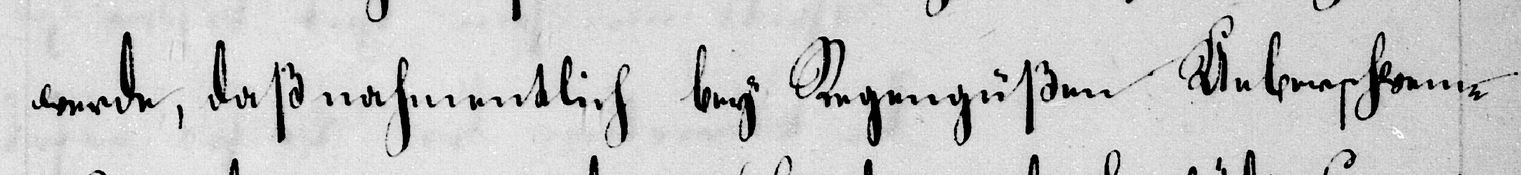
werde, daß nahmentlich bey Regengüßen Ueberschwem¬
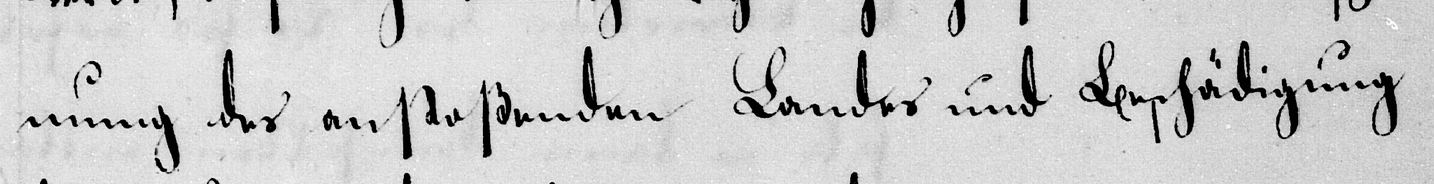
mung des anstoßenden Landes und Beschädigung
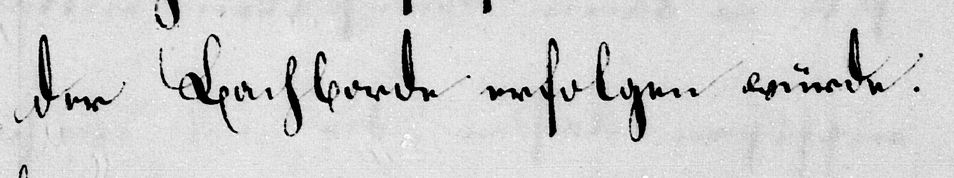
der Bachborde erfolgen würde.
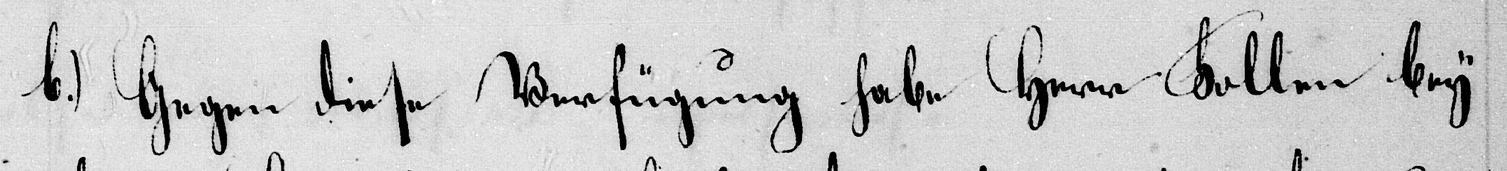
b.) Gegen diese Verfügung habe Herr Follen bey
